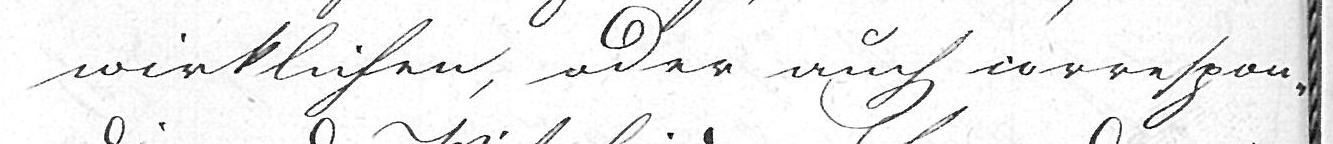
wirklichen, oder auch correspon-
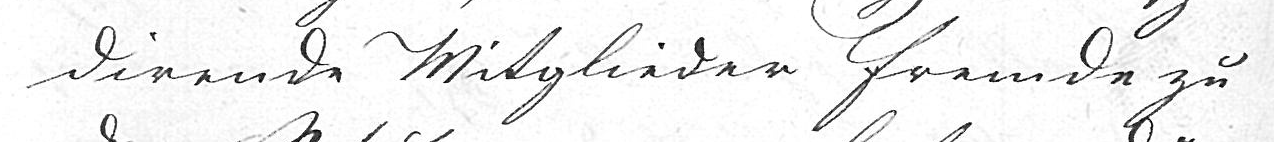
dirende Mitglieder Fremde zu
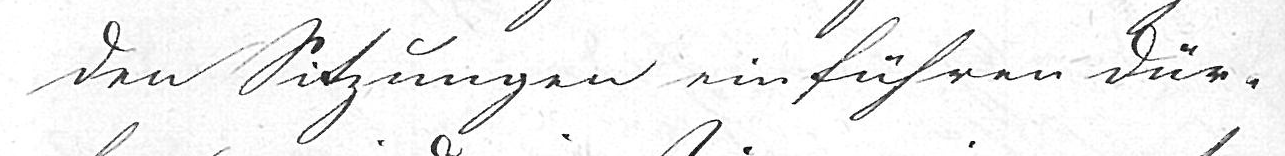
den Sitzungen einführen dür-
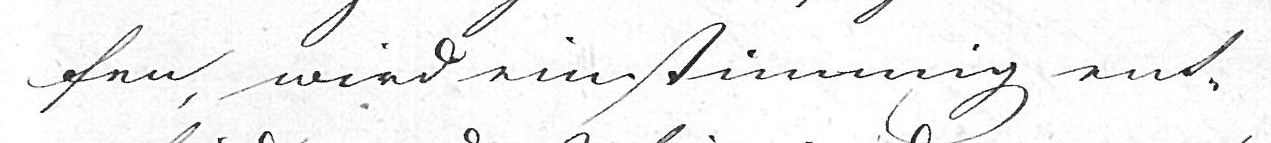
fen, wird einstimmig ent-
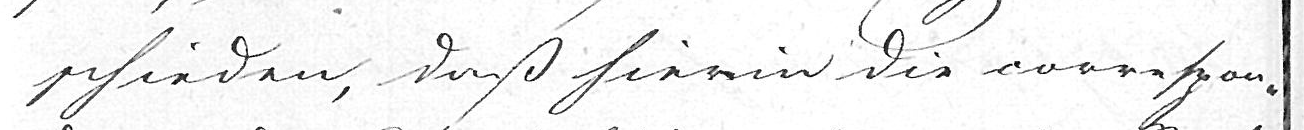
schieden daß hierin die correspon-
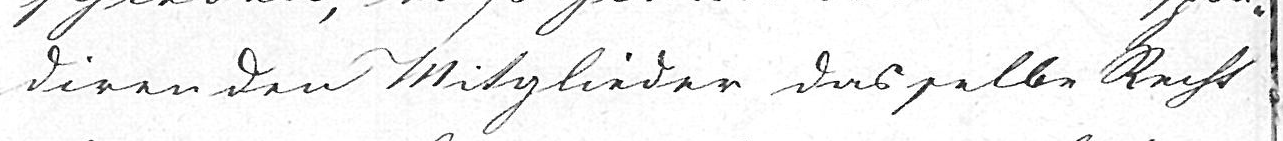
direnden Mitglieder das selbe Recht
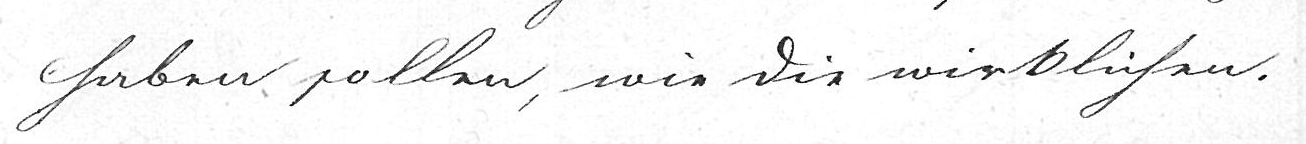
haben sollen, wie die wirklichen.
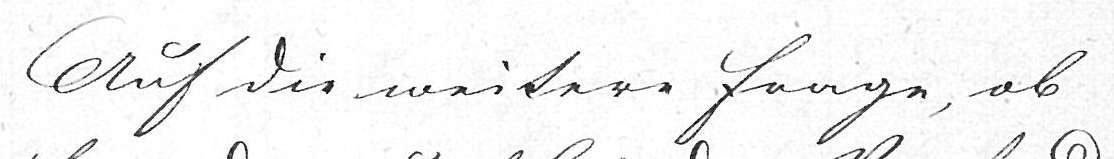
Auf die weitere Frage, ob
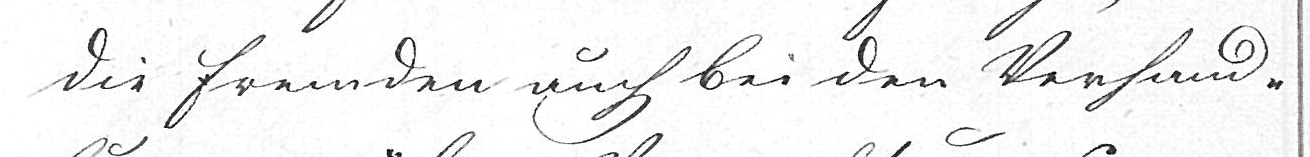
die Fremden auch bei den Verhand-
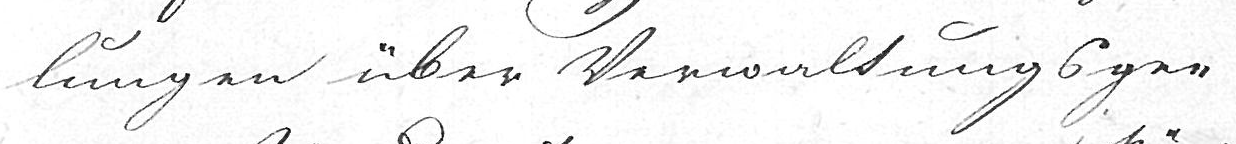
lungen über Verwaltungsge-
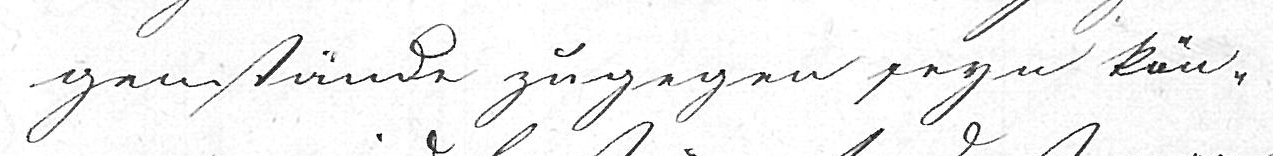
genstände zugegen seyn kön-
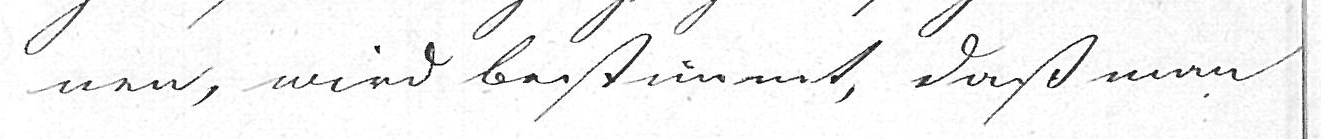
nen, wird bestimmt, daß man
